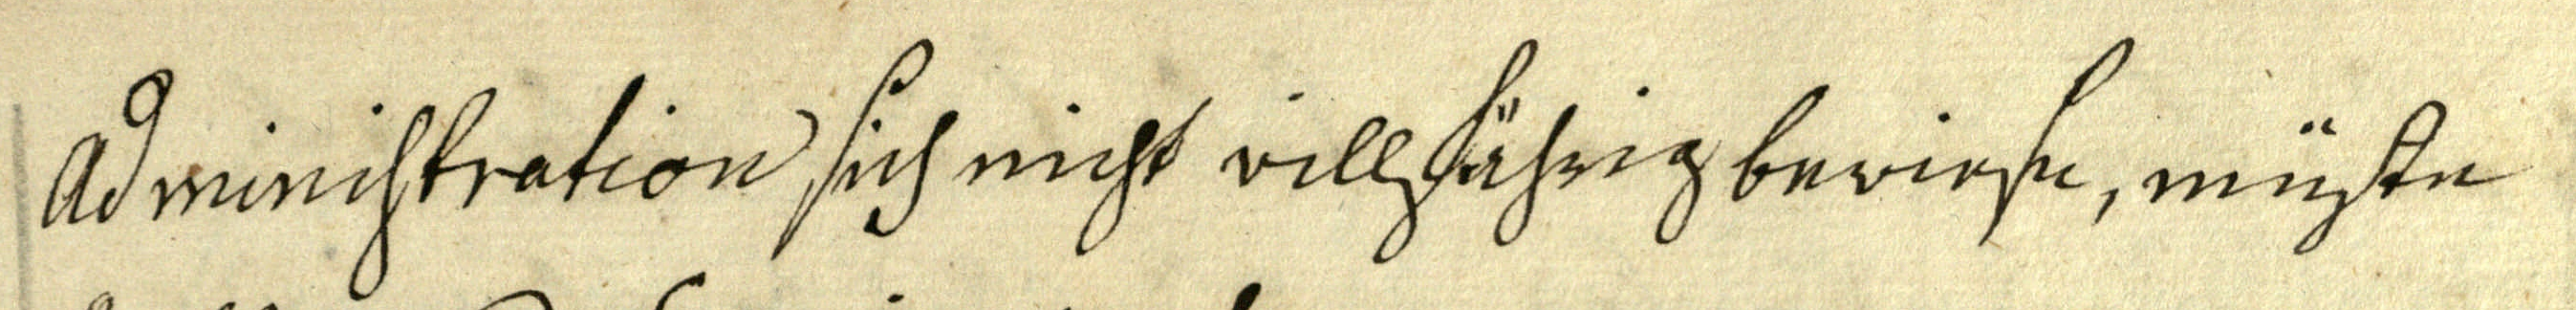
Administration sich nicht willfährig bewiese, müste
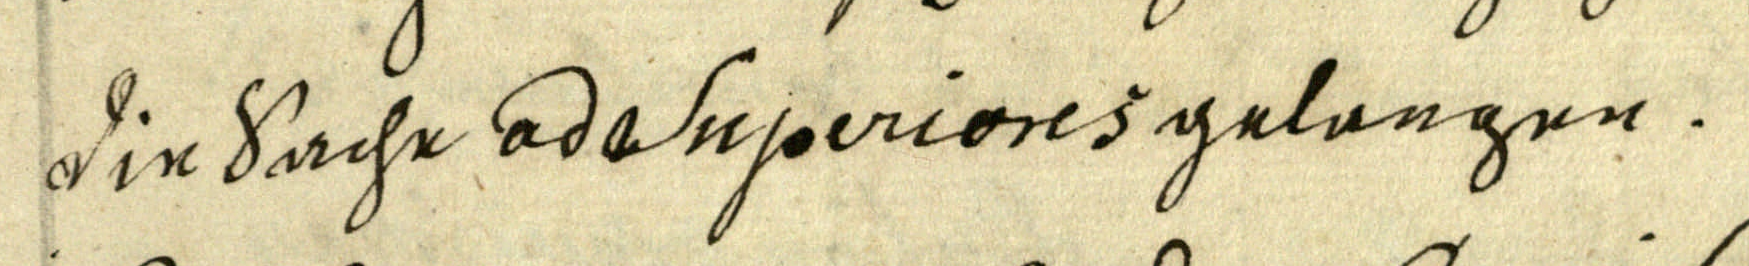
die Sache ad Superiores gelangen.
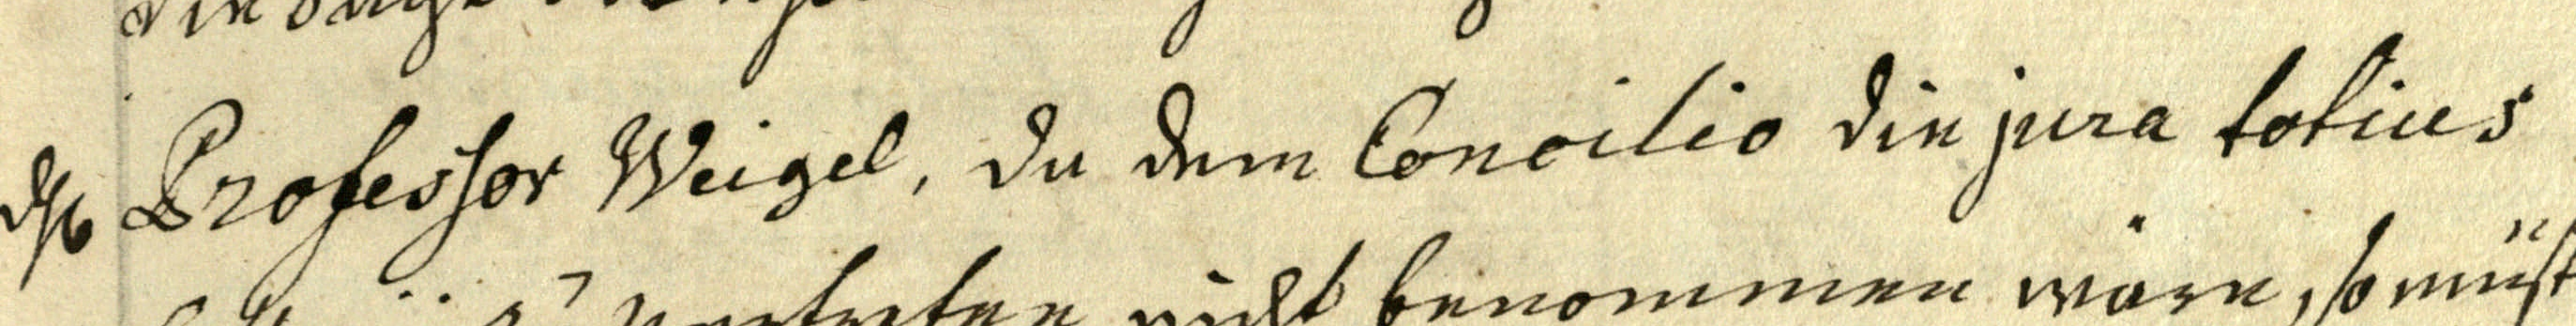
dh Professor Weigel, Da dem Concilio die jura totius
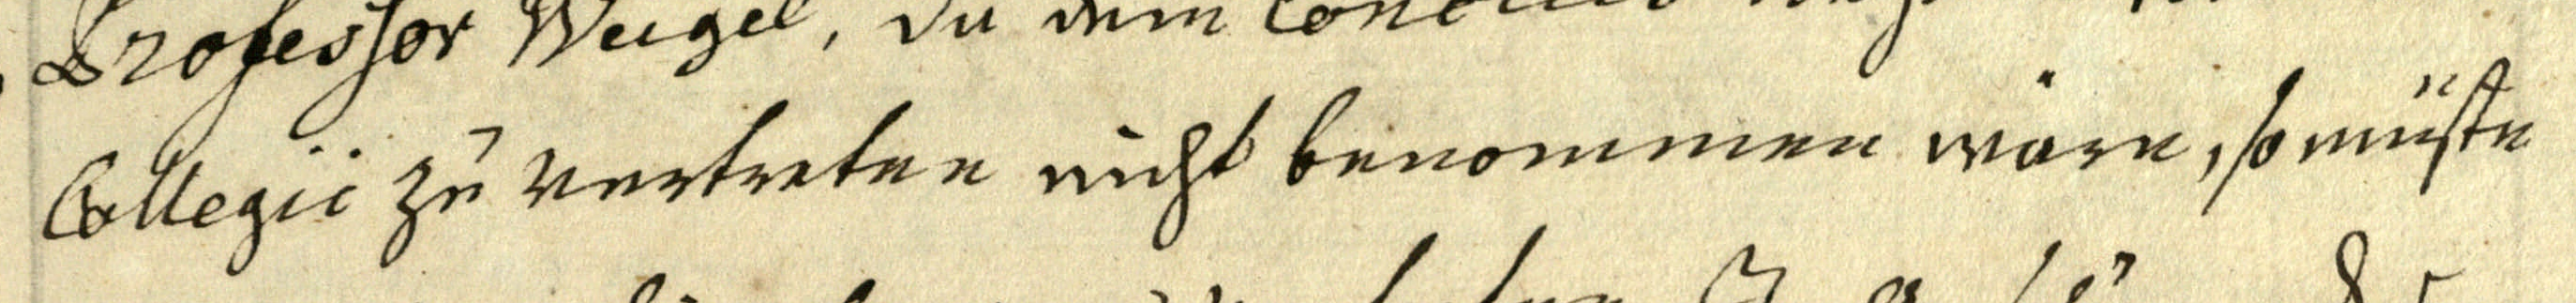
Collegii zu vertreten nicht benommen wäre, so müste
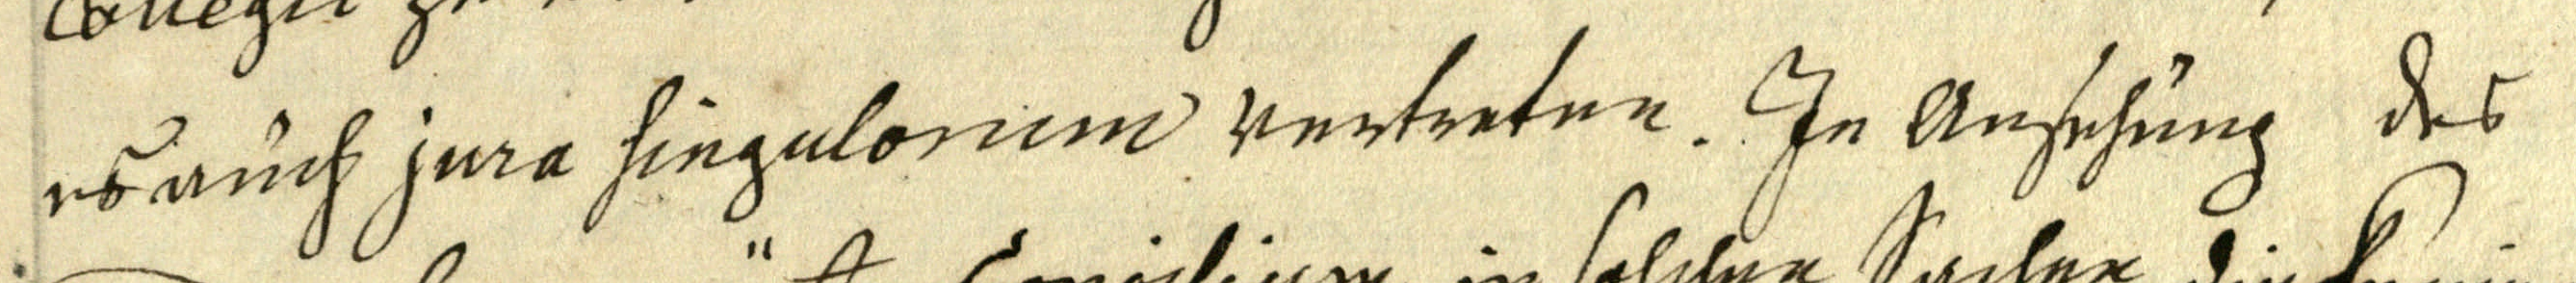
es auch jura singulorum vertreten. In Ansehung des
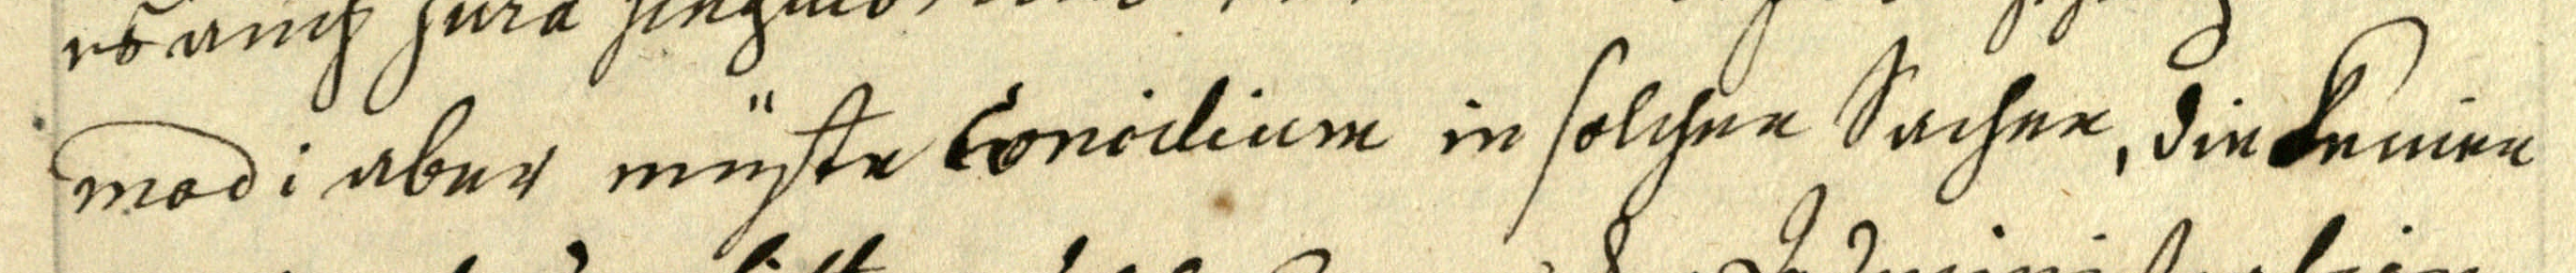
modi aber müste Concilium in solchen Sachen, die keinen
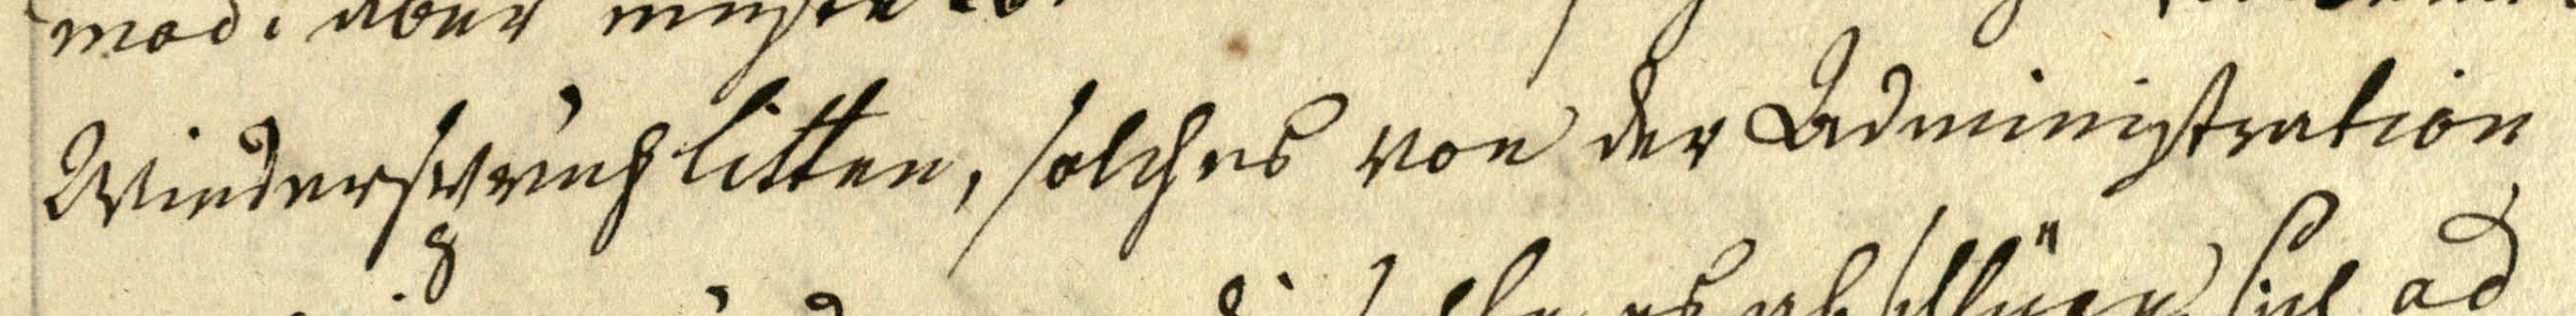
Wiederspruch litten, solches von der Administration
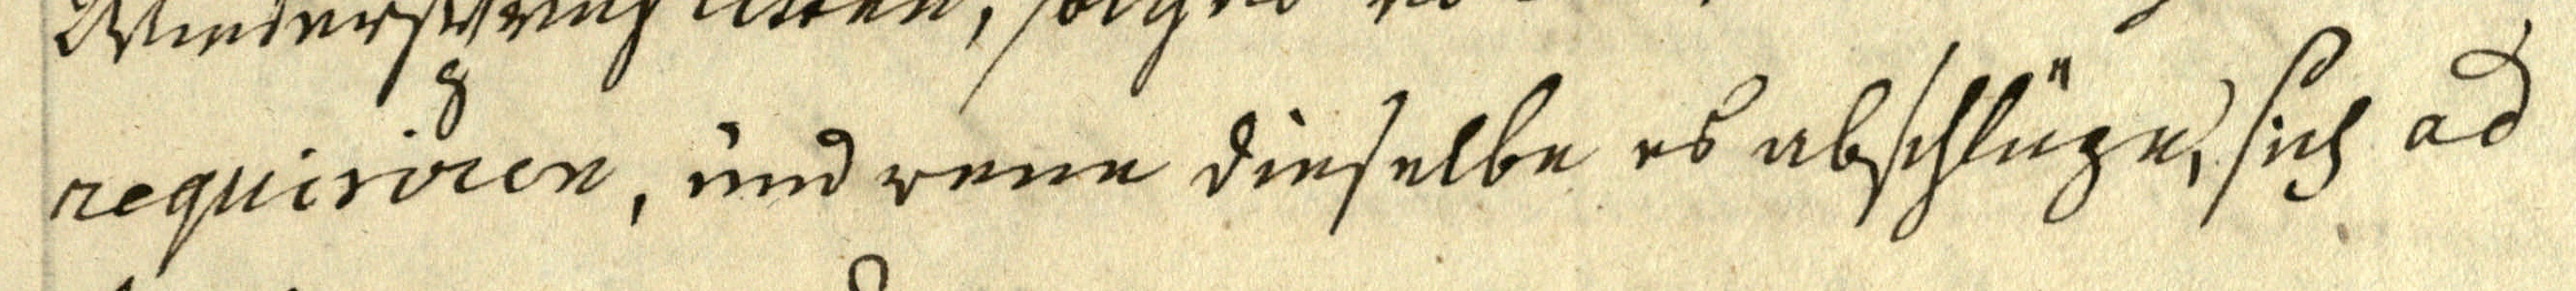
requiriren, und wenn dieselbe es abschlüge, sich ad
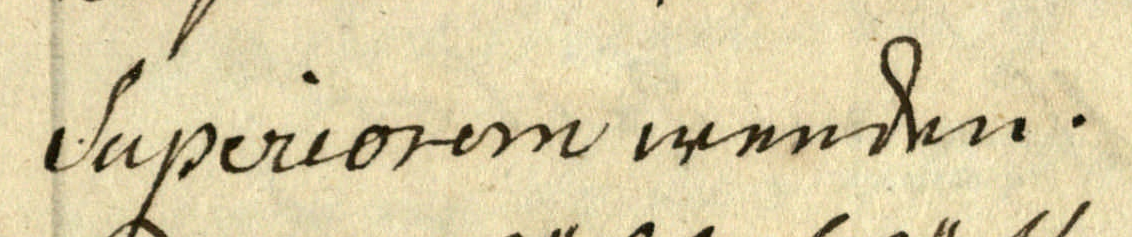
Superiorum wenden.
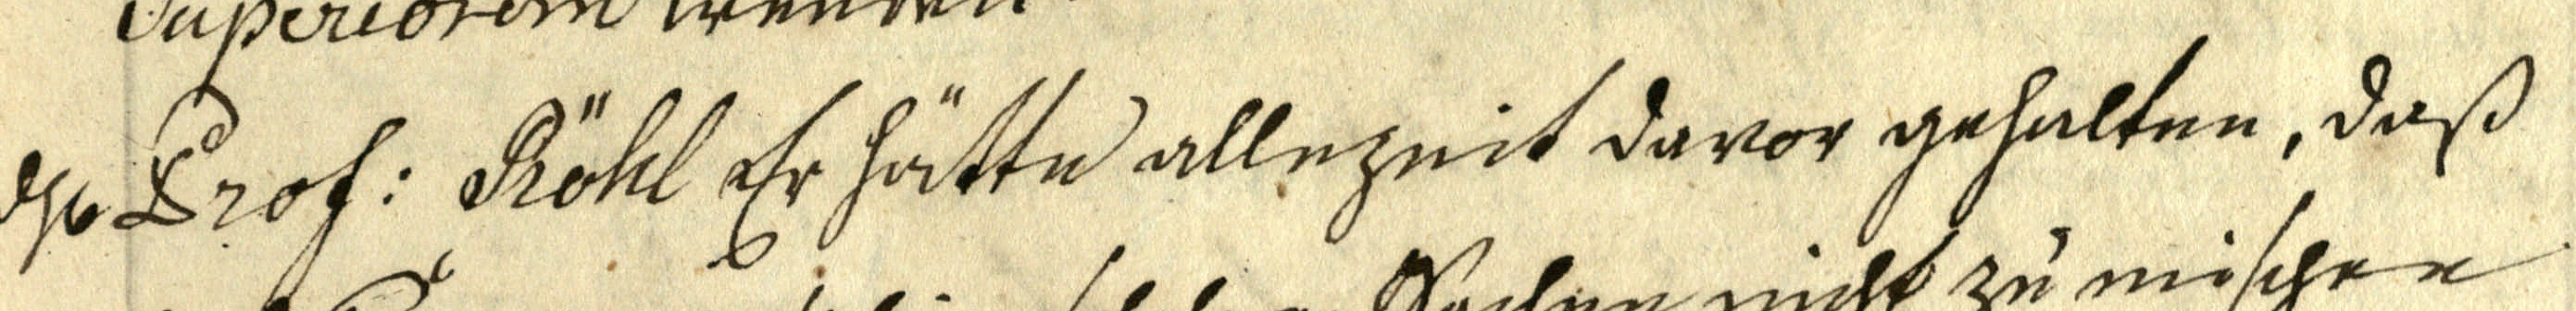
das Prof. Röhl Er hätte allezeit davor gehalten, daß
